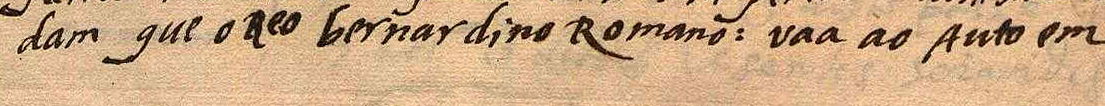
dam que o Reo bernardino Romano vaa ao Auto em
